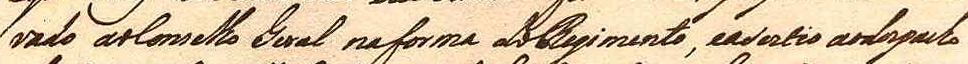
vado ao Conselho Geral na forma do Regimento, e asestio ao despacho
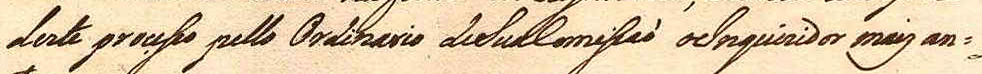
deste processo pello Ordinario de Sua Comissaõ o Inquizidor mais an
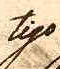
tigo
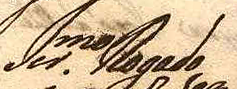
Ier.mo Rogado
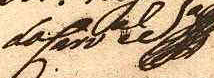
do Carval e Sa
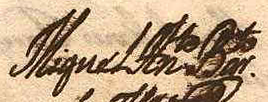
Miguel An.to Bar.to
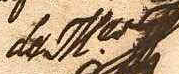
de M.es
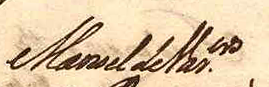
Manoel de Vas.cos
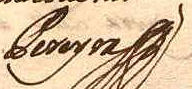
Pereyra
